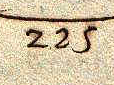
225
